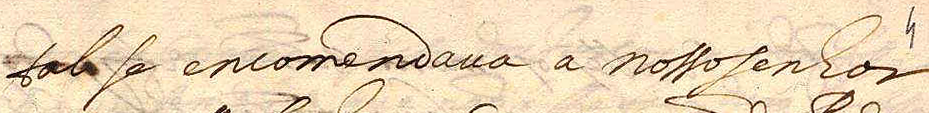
tal se encomendaua a nosso senhor
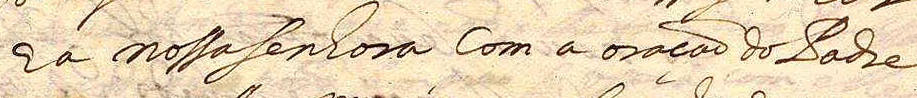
E a nossa Senhora com a oração do Padre
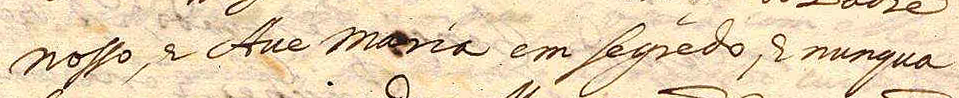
nosso, E Aue maria em segredo, E nunqua
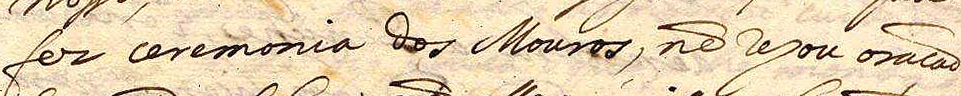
fez ceremonia dos Mouros, nē Rezou oraçaõ
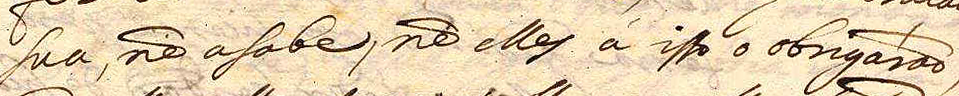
sua, nē a sabe, nē elles a isto o obrigarão
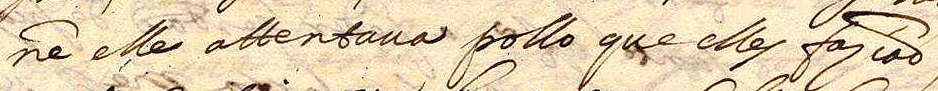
nē elle attentaua pollo que elles faziaõ
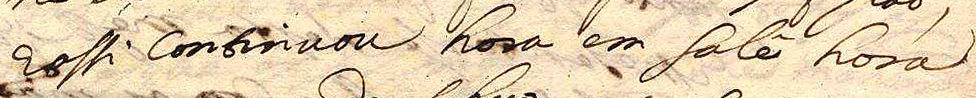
E assi continuou hora em Salē hora
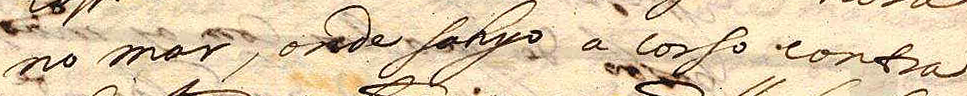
no mar, onde sahyo a corso contra
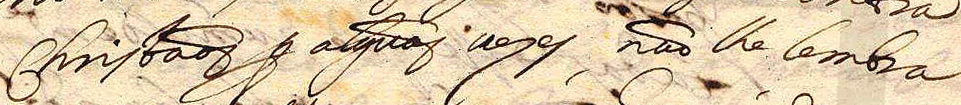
Christãos ꝑ algūas uezes, naõ lhe lembra
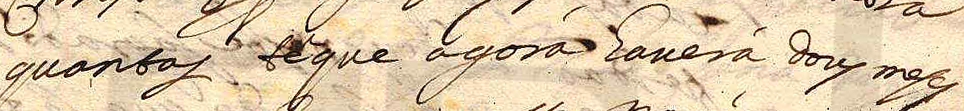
quantas té que agora hauerá dous meses
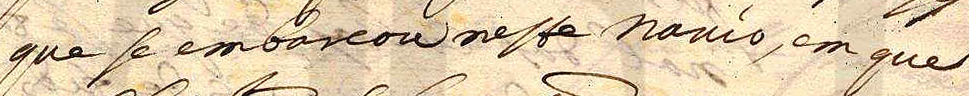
que se embarcou neste nauio, em que
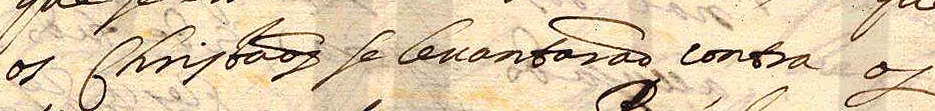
os Christãos se leuantarão contra os
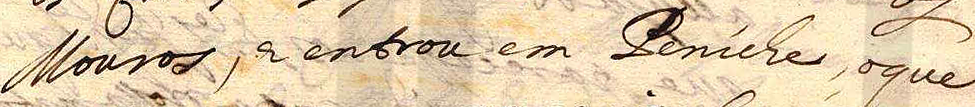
Mouros, E entrou em Peniche, o que
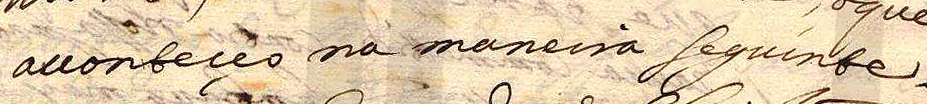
aconteceo na maneira seguinte
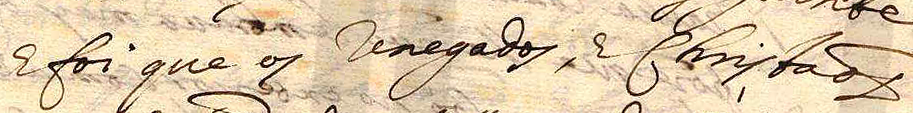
E foi que os renegados, E Christaõs
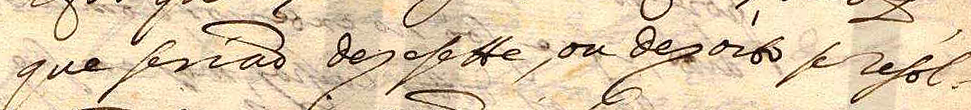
que serião dezesette, ou dezoito se resol
